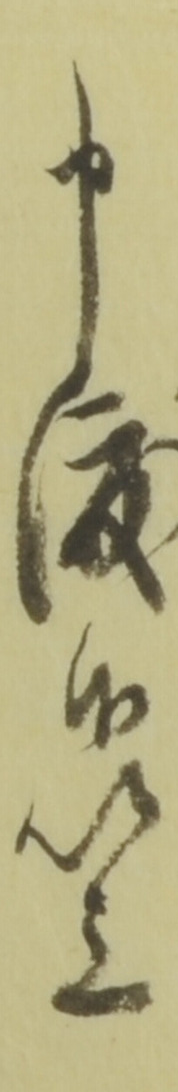申渡候以上
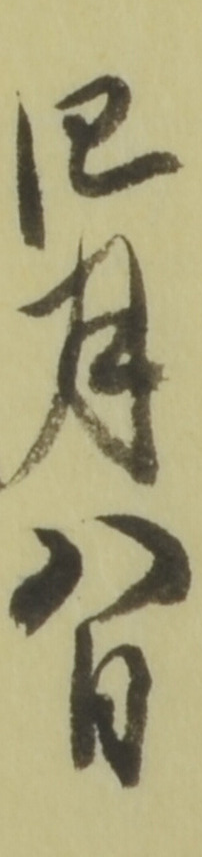四月八日
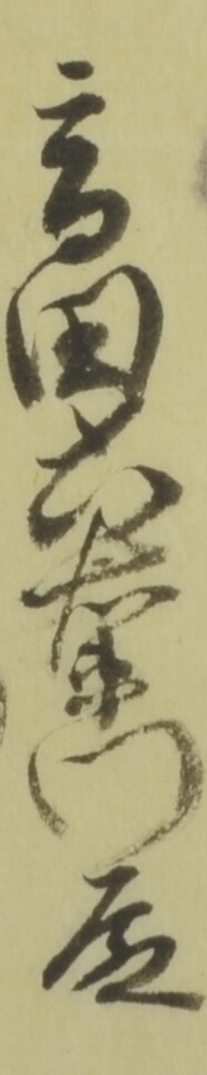高田六右衛門殿
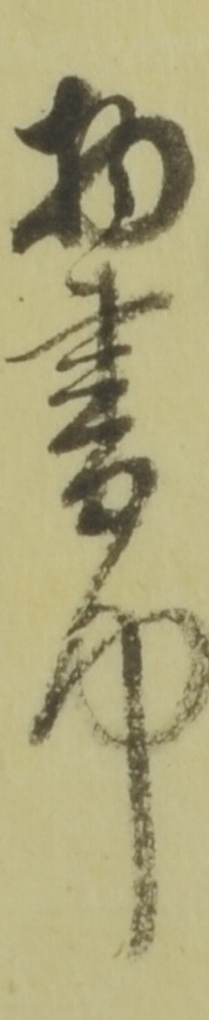物書中
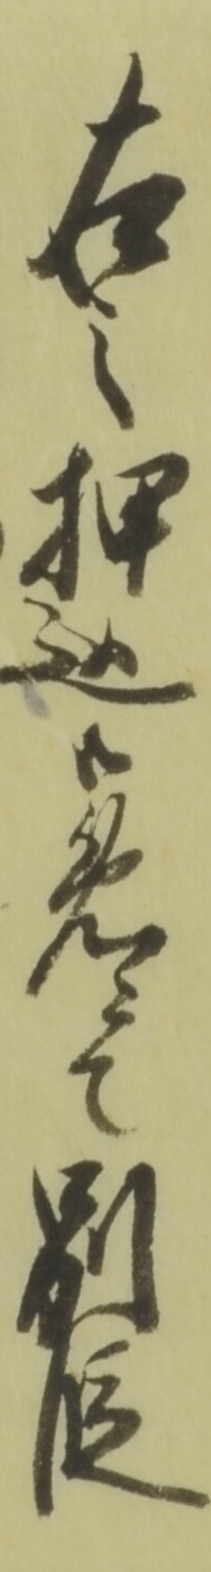右之押込御免ニて別段
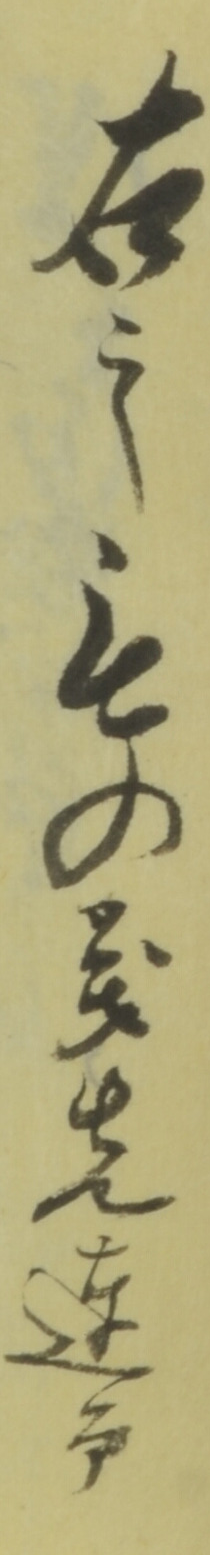右之もの義先達而
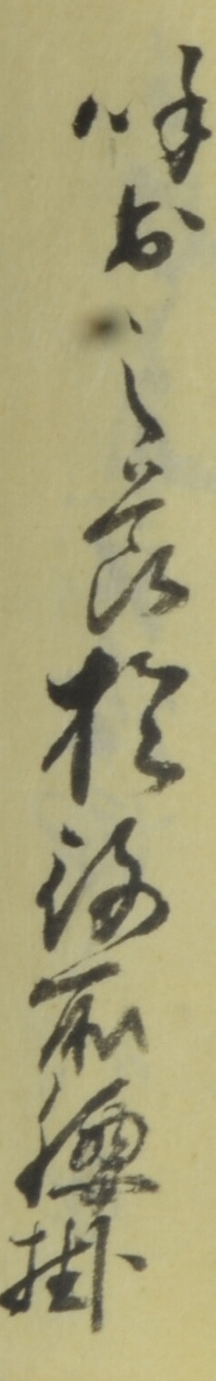呼出之節猶役所腰掛

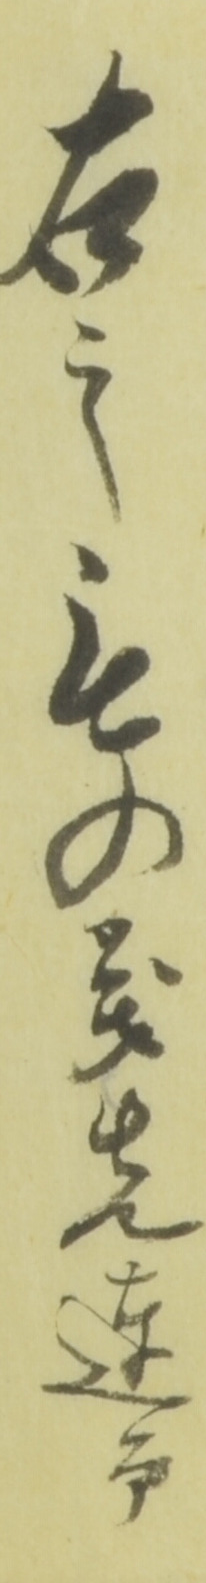右之もの義先達而
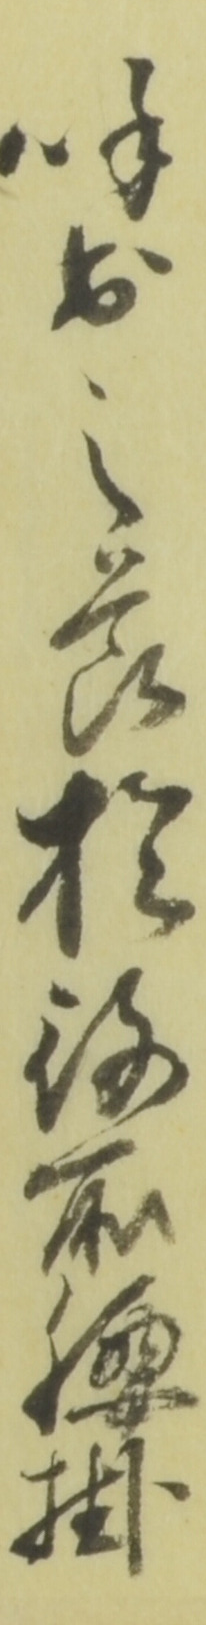呼出之節御役所腰掛
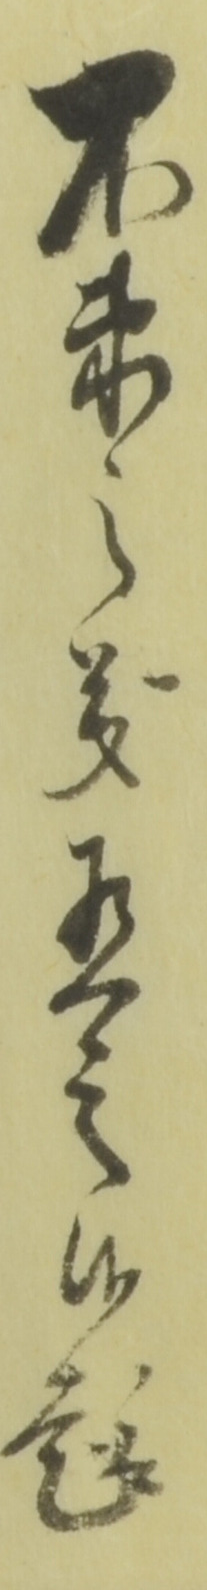不束之義有之候趣
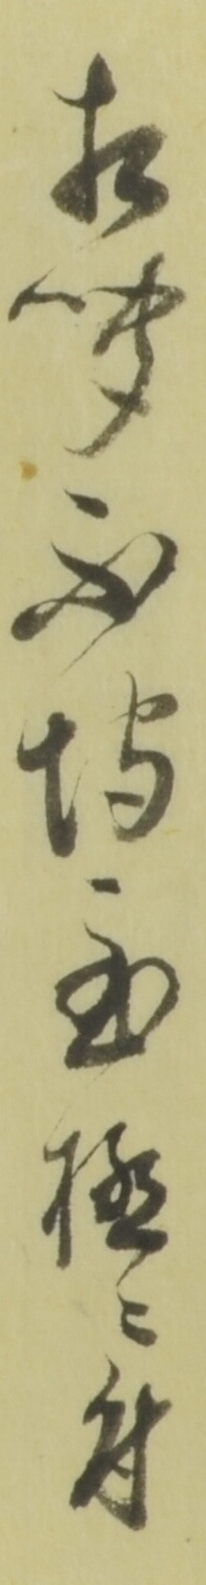相聞不埒至極ニ付
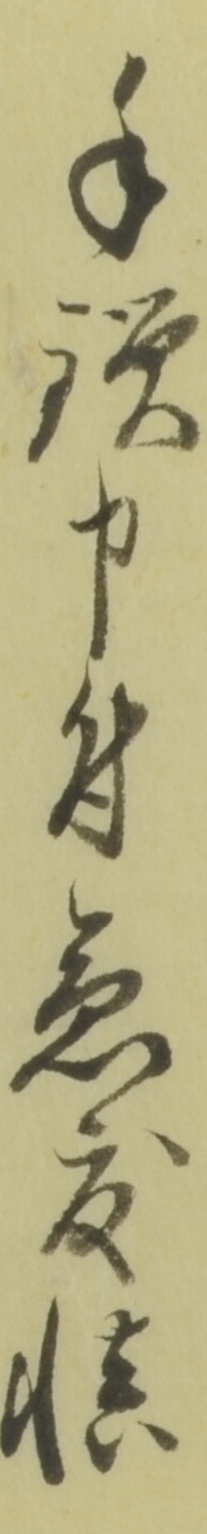手鎖申付急度慎
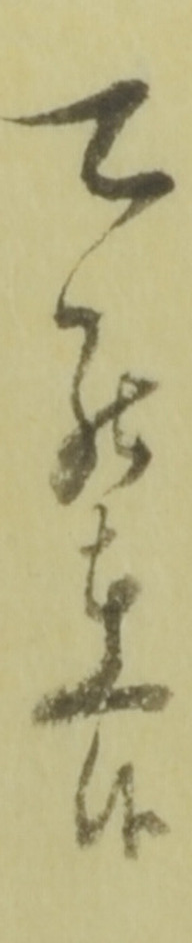可罷在候
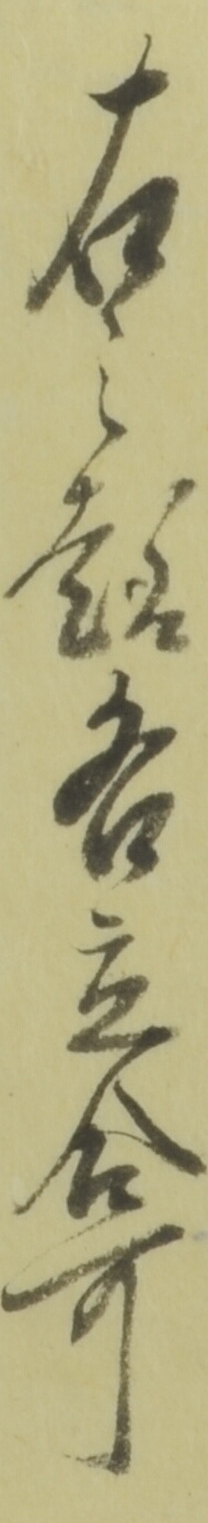右之趣各立合可
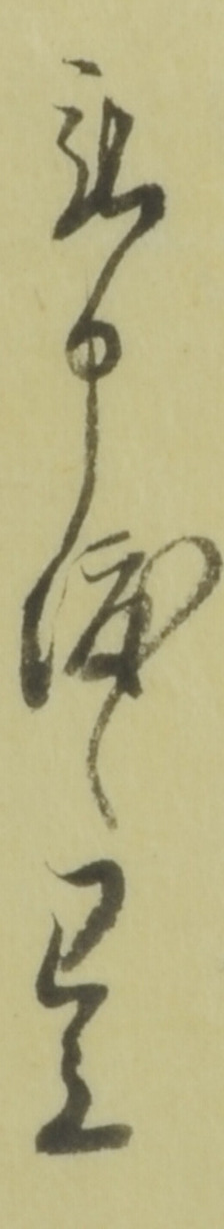被申渡候已上
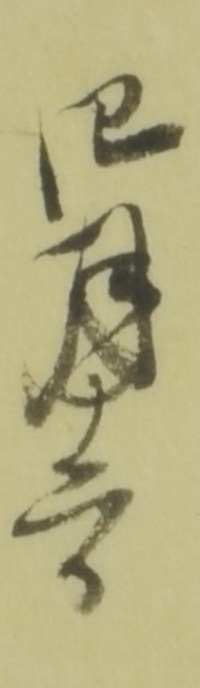四月十二日
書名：御触書御書附控
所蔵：伊那市立高遠町図書館・合同会社AMANE
